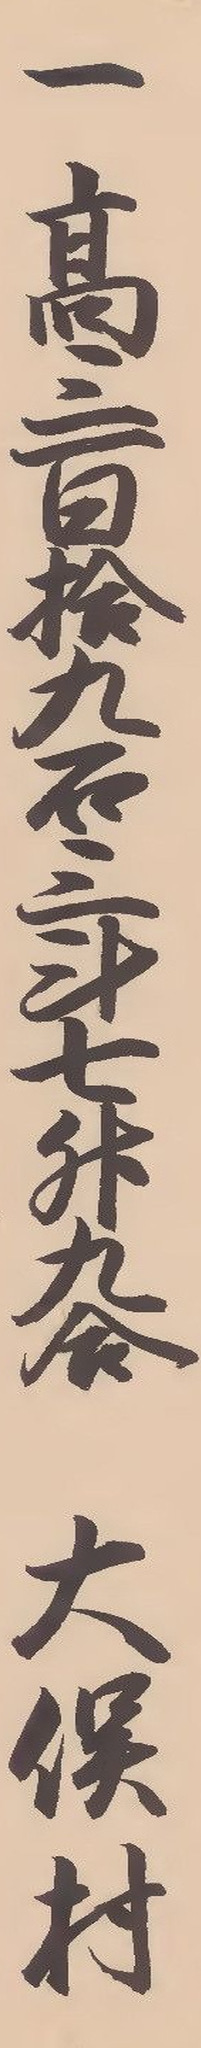一高三百拾九石三斗七升九合大俣村
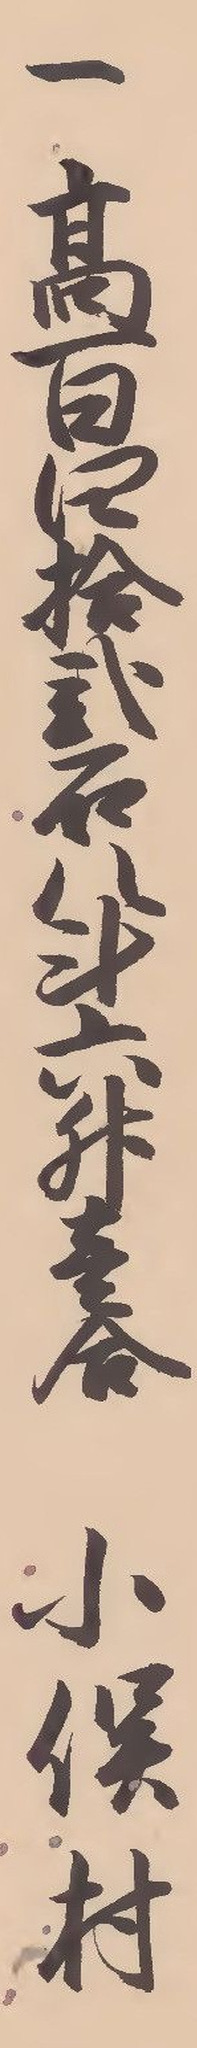一高百四拾弐石八斗六升壱合小俣村

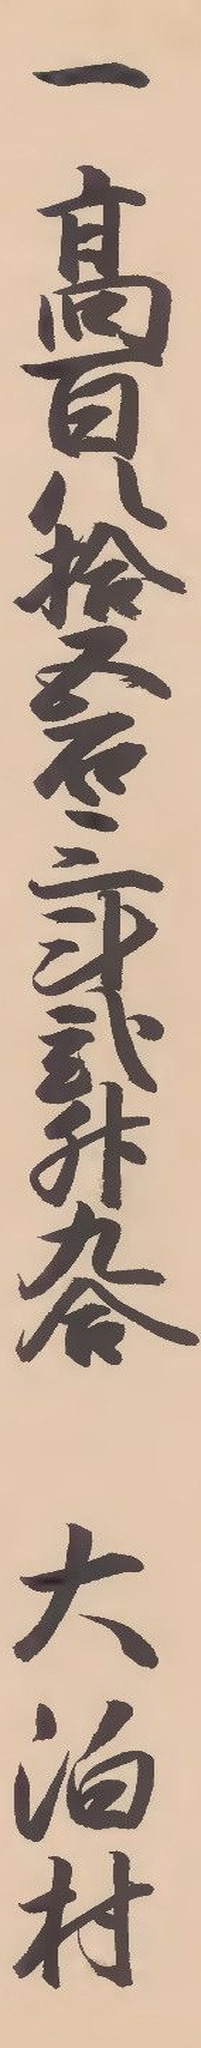一高百八拾五石三斗弐升九合大泊村
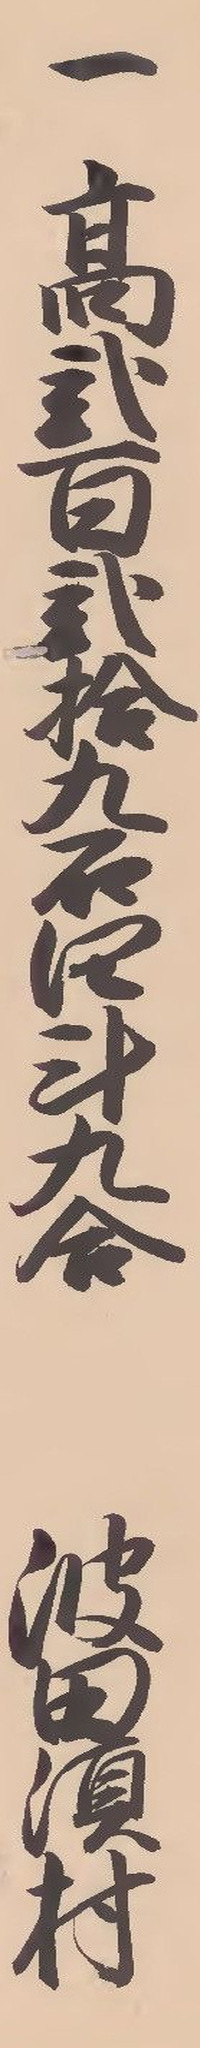一高弐百弐拾九石四斗九合波田須村
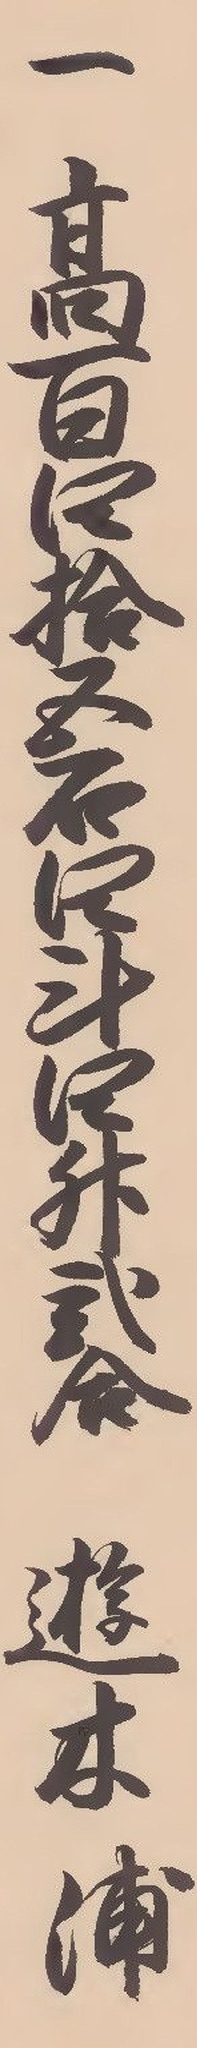一高百四拾五石四斗四升弐合遊木浦
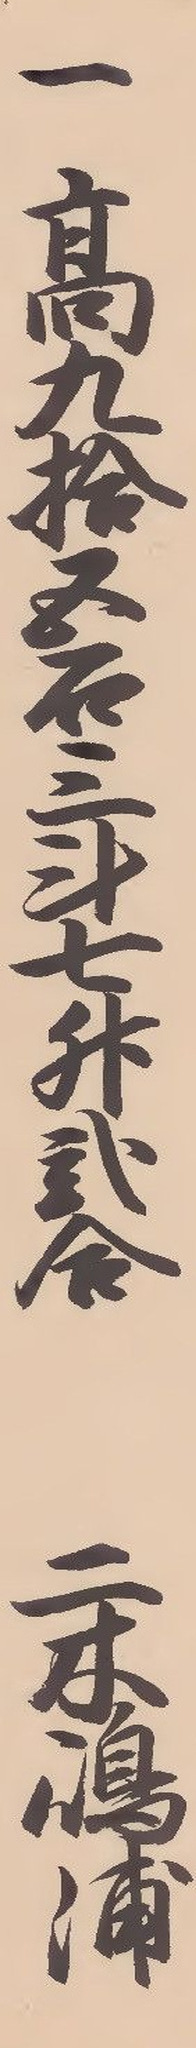一高九拾五石三斗七升弐合二木島浦
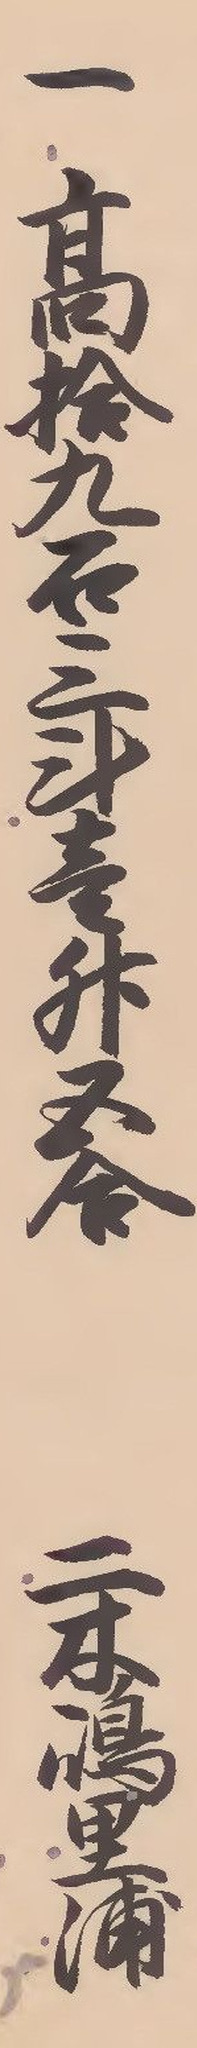一高拾九石三斗壱升五合二木島里浦

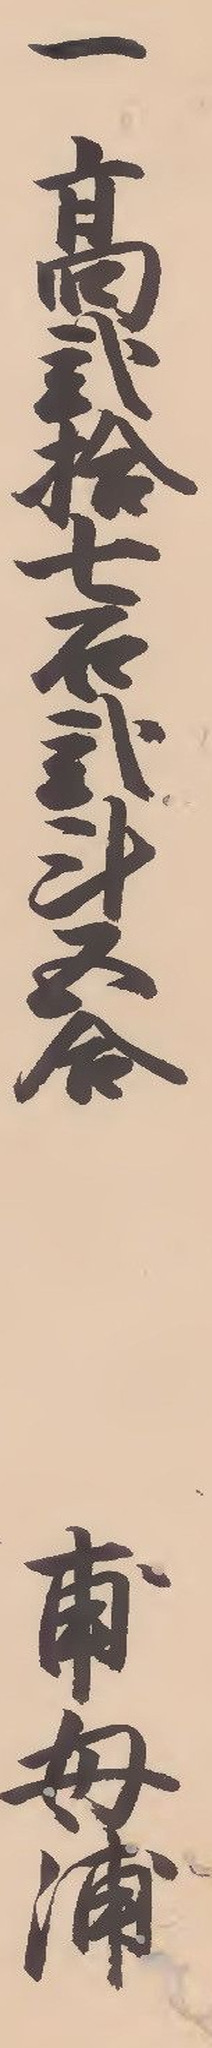一高弐拾七石弐斗五合甫母浦
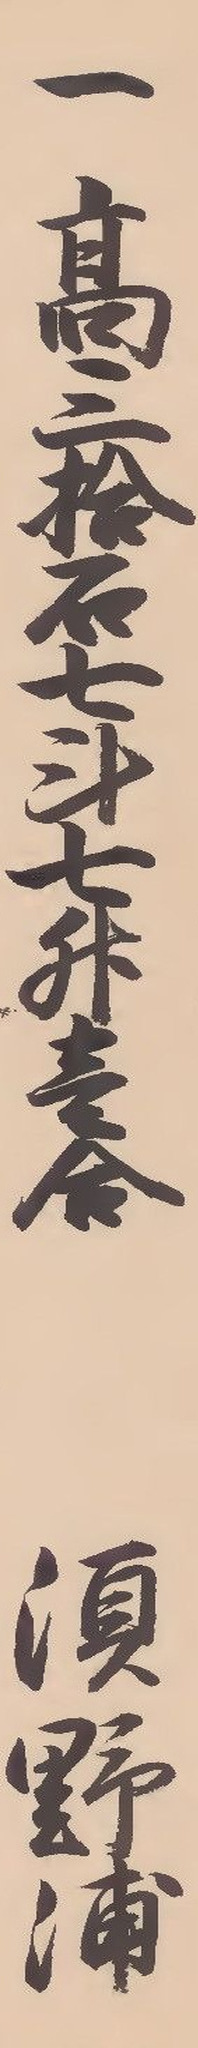一高三拾石七斗七升壱合須野浦
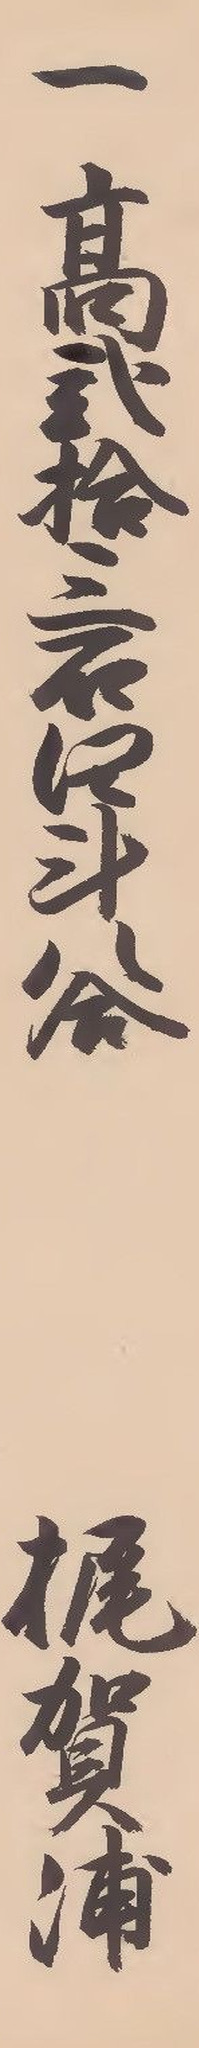一高弐拾三石四斗八合梶賀浦
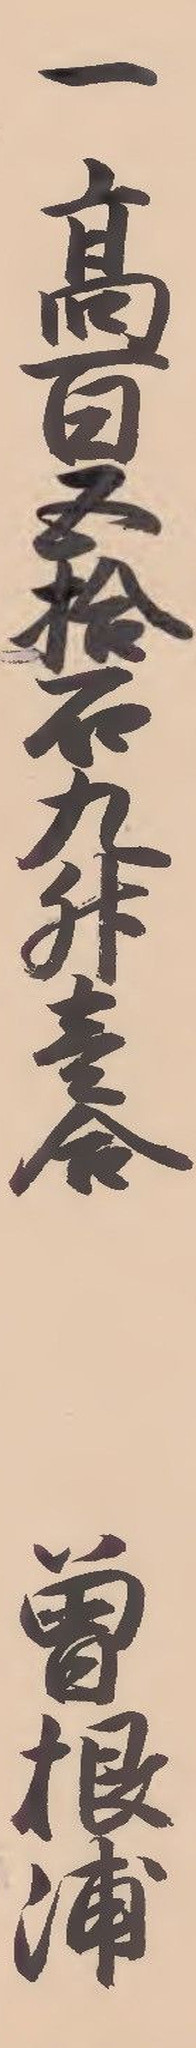一高百五拾石九升壱合曽根浦
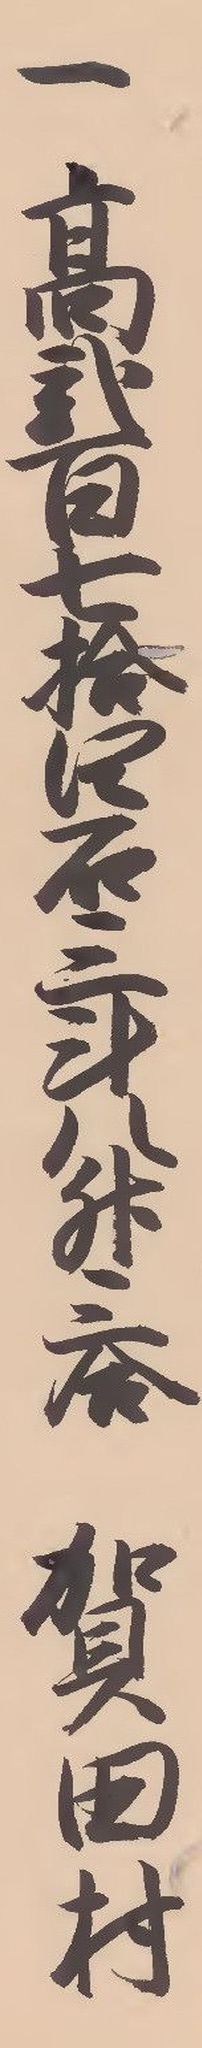一高弐百七拾四石三斗八升三合賀田村
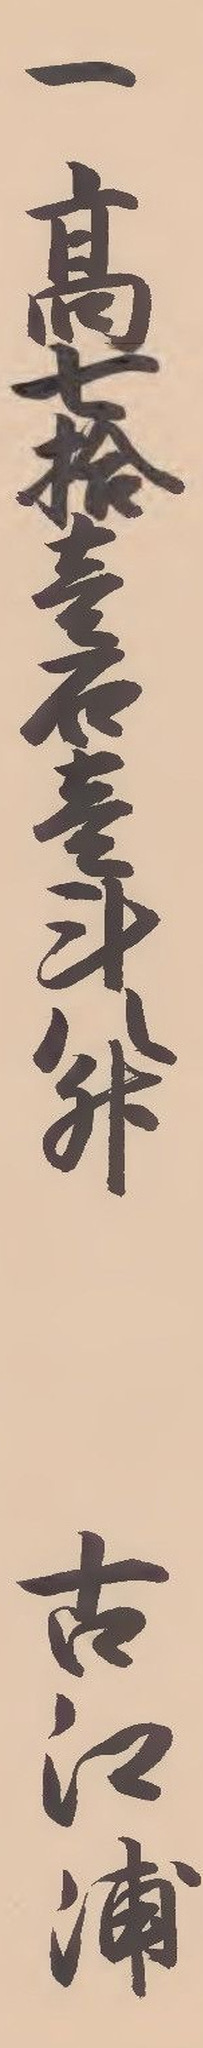一高七拾壱石壱斗八升古江浦
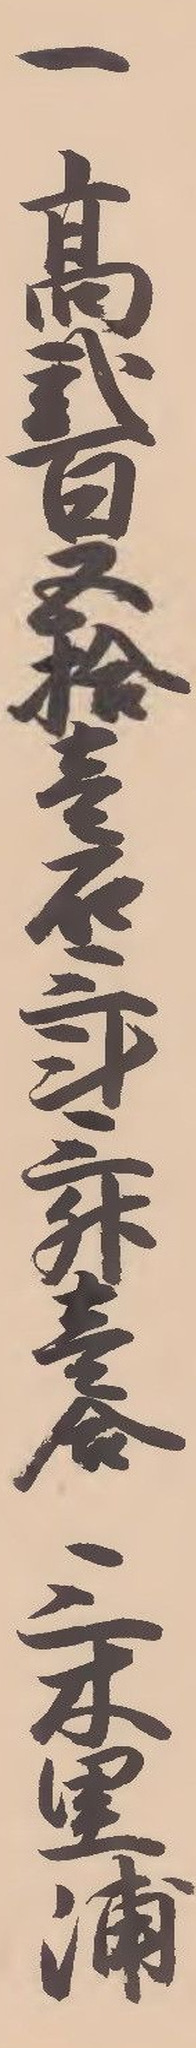一高弐百五拾壱石三斗三升壱合三木里浦
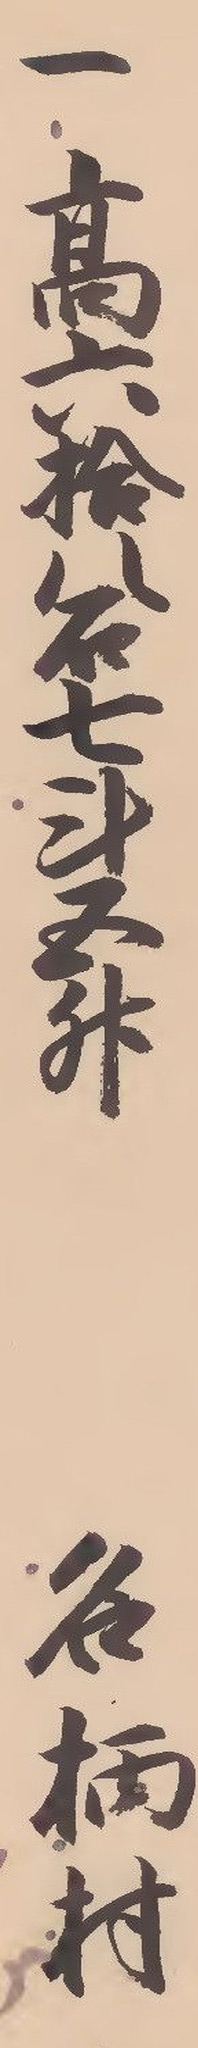一高六拾八石七斗五升名柄村

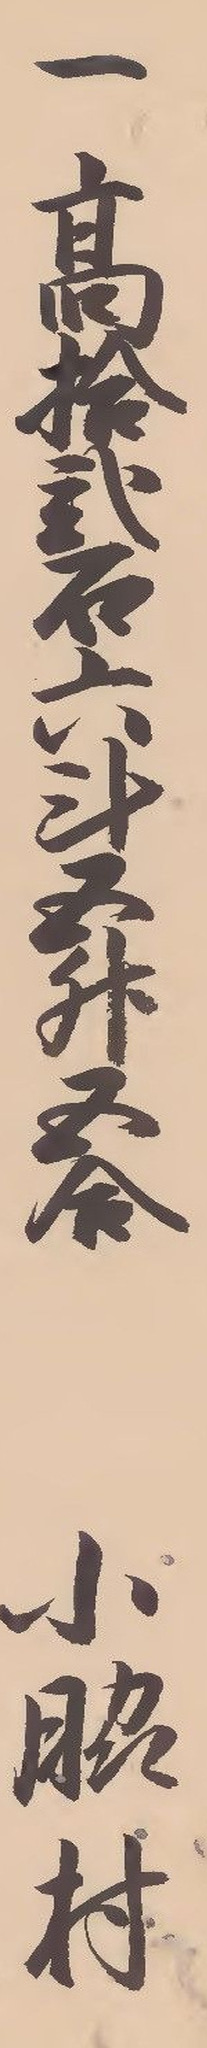一高拾弐石六斗五升五合小脇村
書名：紀伊国郷帳
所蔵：国立公文書館 National Archives of Japan
